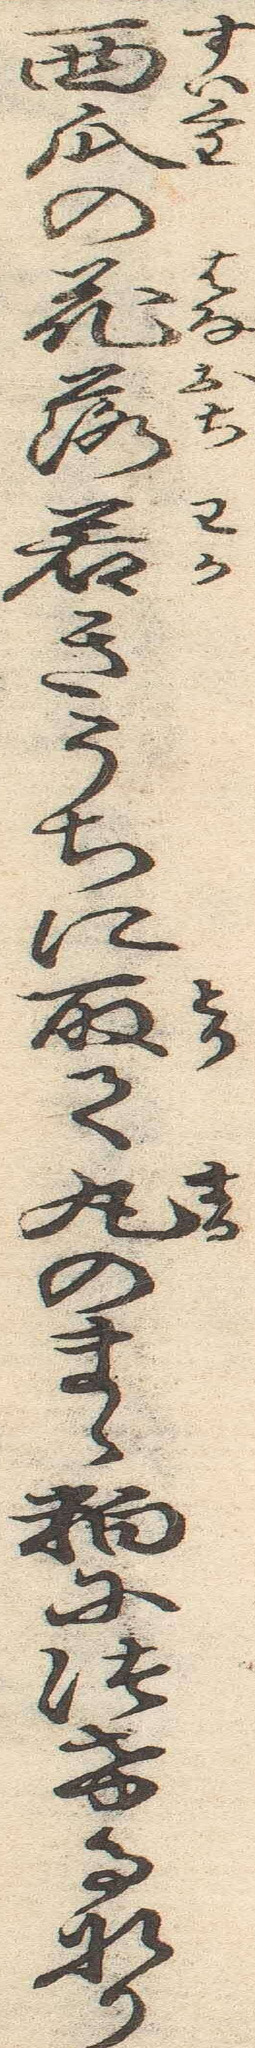西瓜の花落若きうちに取て丸のまゝ粕につけるなり

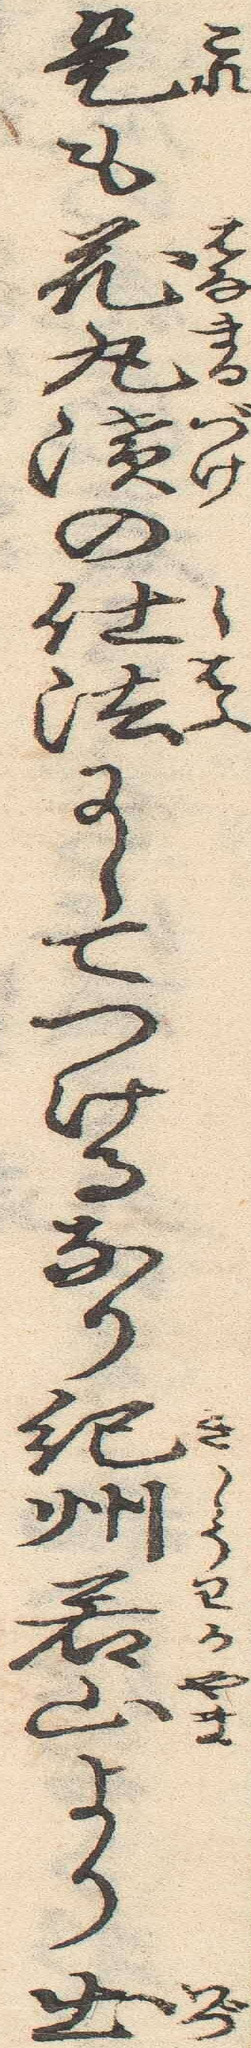是も花丸漬の仕法にしてつけるなり紀州若山より出
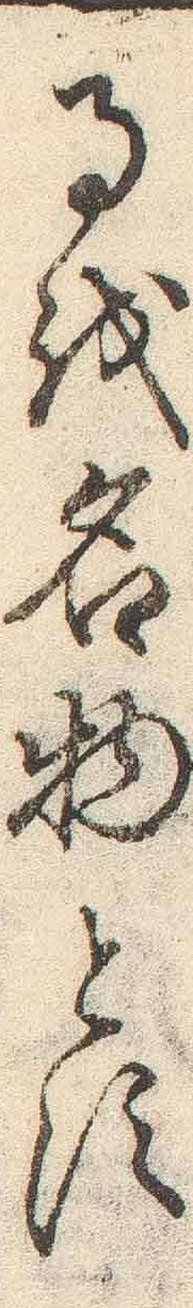るを名物とす
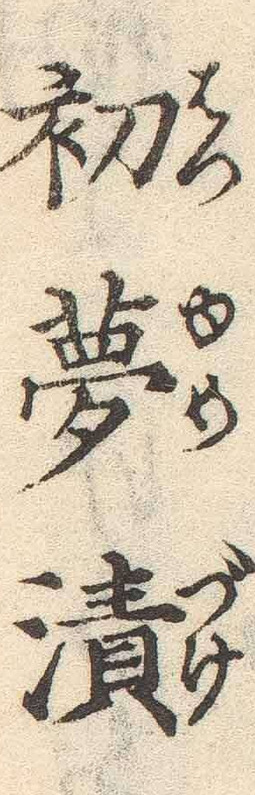初夢漬
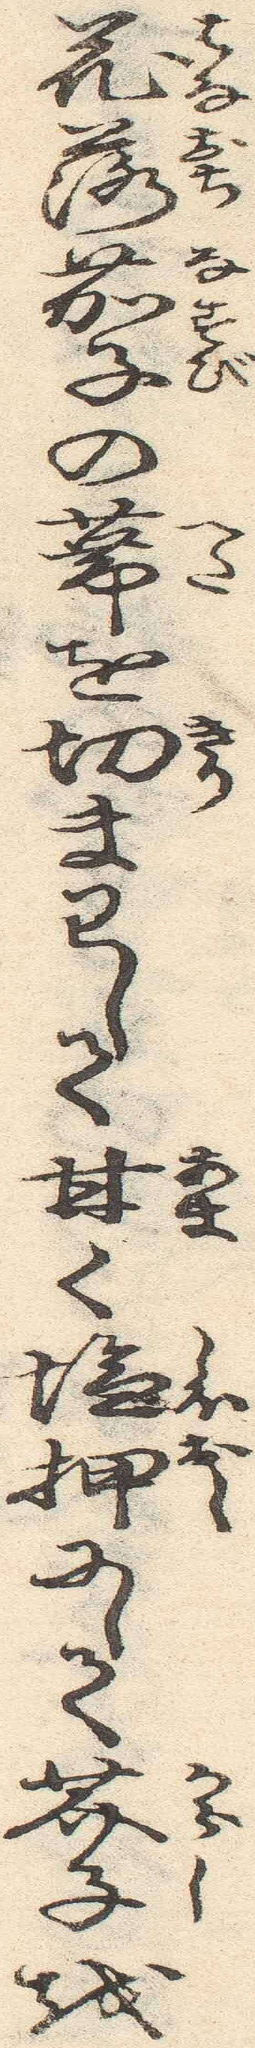花落茄子の蔕を切まわして甘く塩押にして芥子を
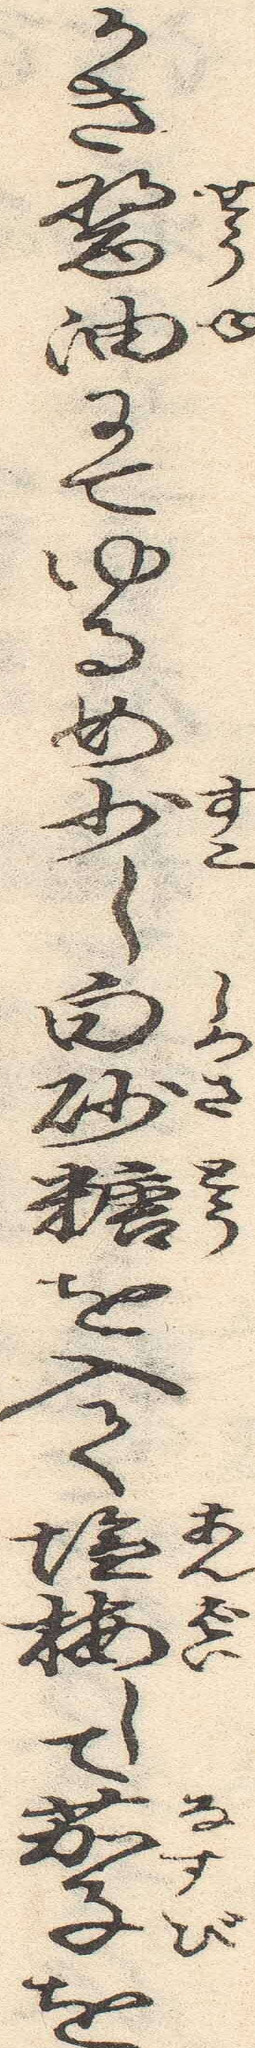かき醤油にてゆるめ少し白砂糖を入て塩梅して茄子を
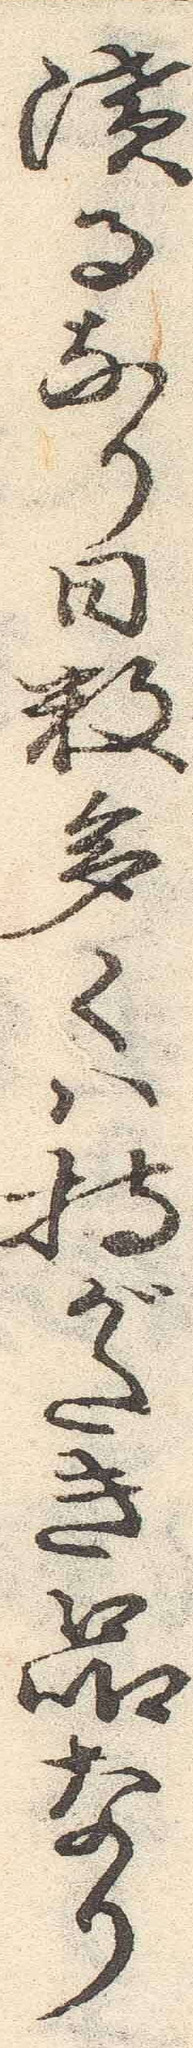漬るなり日数多くは持がたき品なり
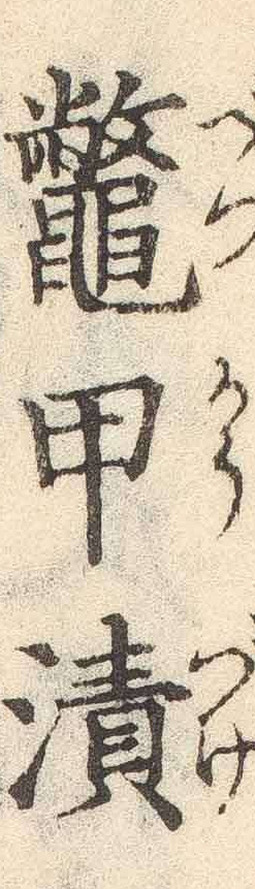鼈甲漬
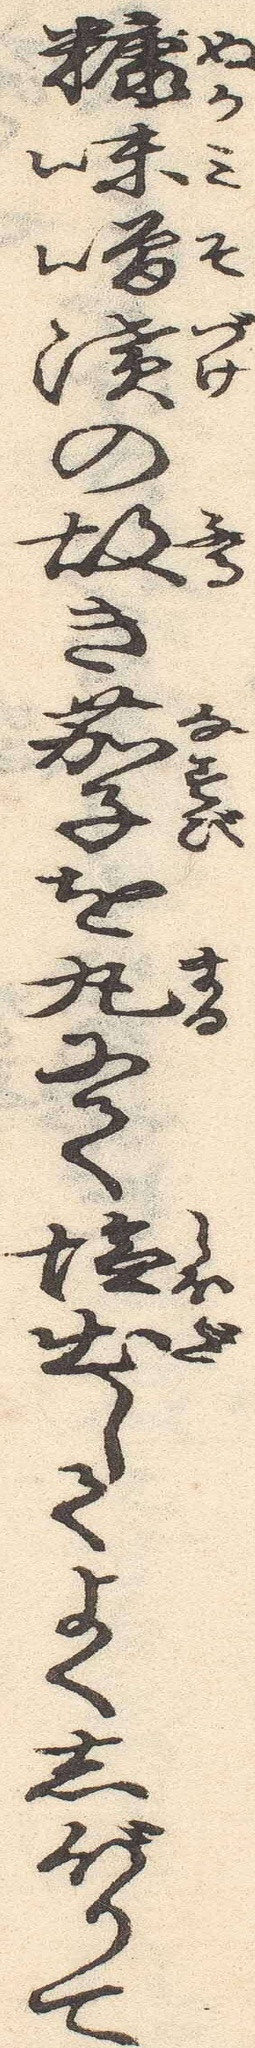糠味噌漬の故き茄子を丸にて塩出してよくしぼりて
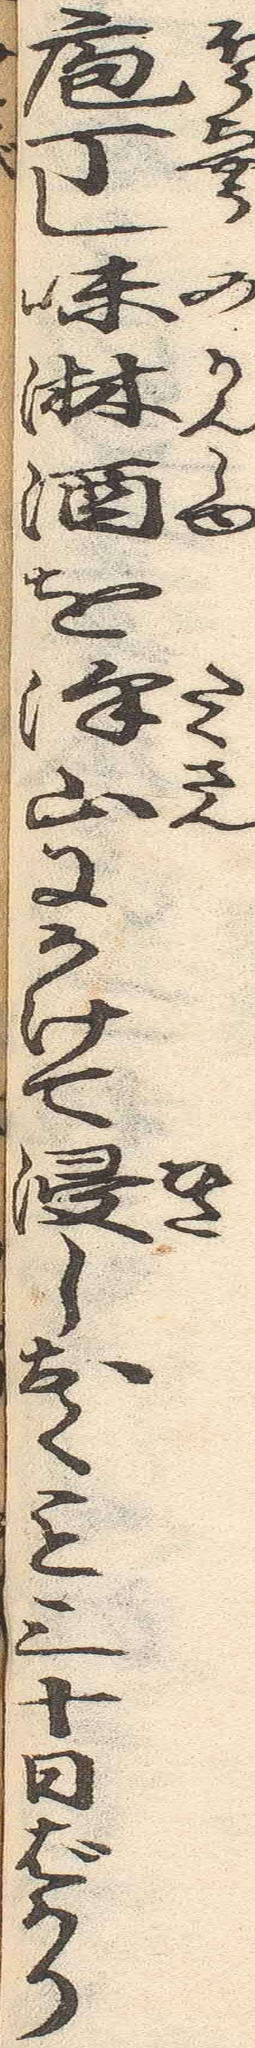庖丁し味淋酒を沢山にかけて浸しおくこと三十日ばかり
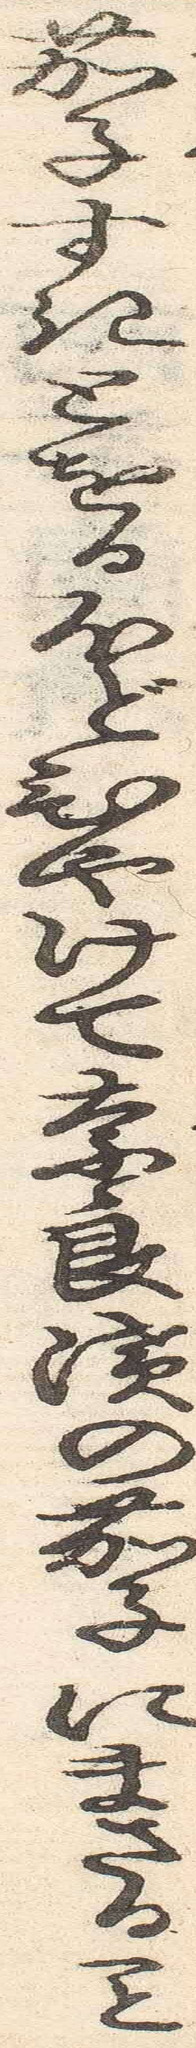茄子すきとをるほどひやけて奈良漬の茄子にまさること
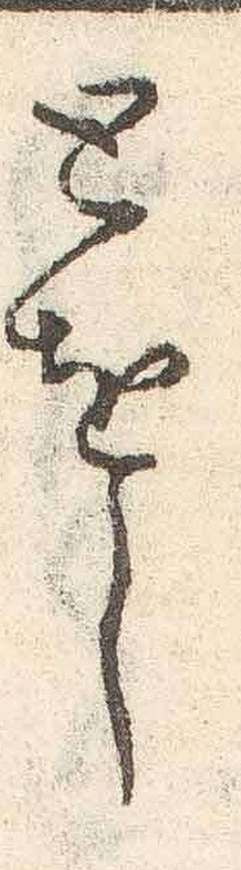とをし
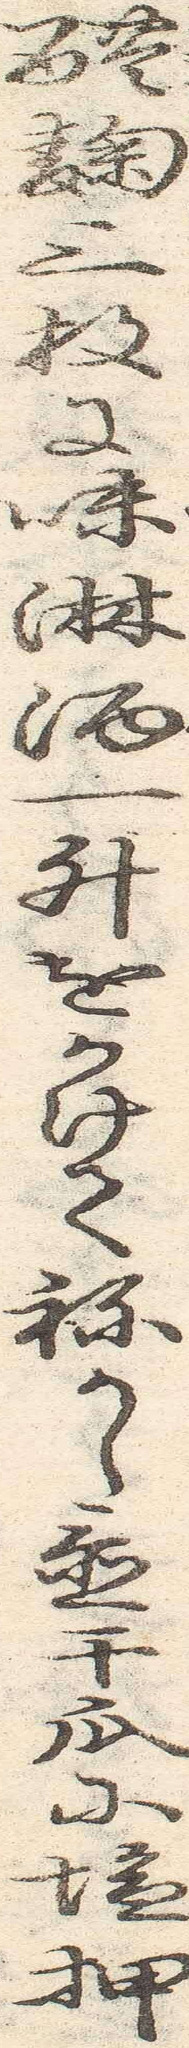醴麹三枚に味淋酒一升をかけてねかし置干瓜に塩押
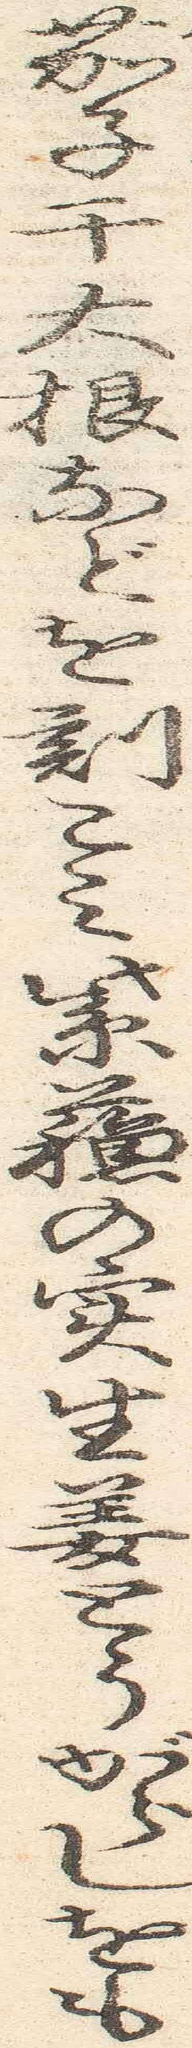茄子干大根などを刻こみ紫蘇の実生姜とうがらしをも
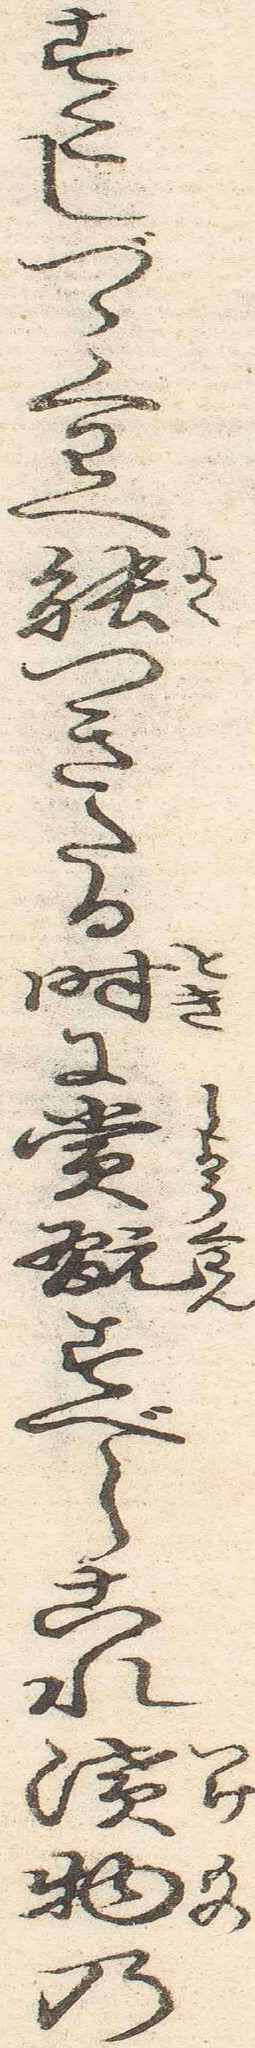すこしづゝくわへ能つきたる時に賞翫すべしこれ漬物の
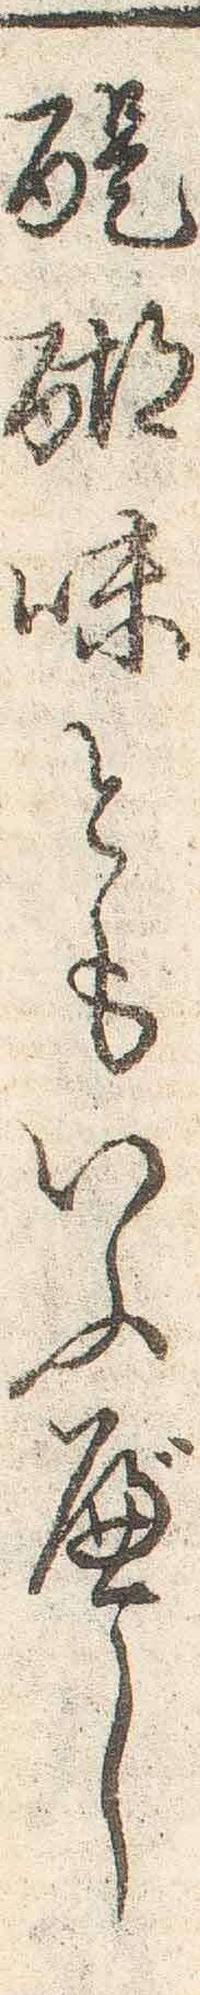醍醐味ともいふべし
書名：四季漬物塩嘉言
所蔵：東京学芸大学附属図書館 国文学研究資料館
